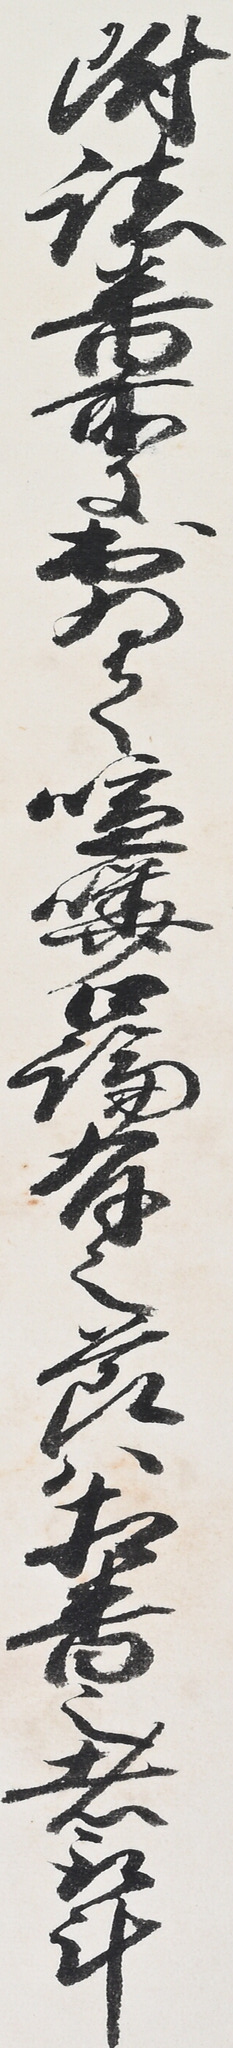附諸番所におゐて喧嘩口論有之節は相番之者取斗
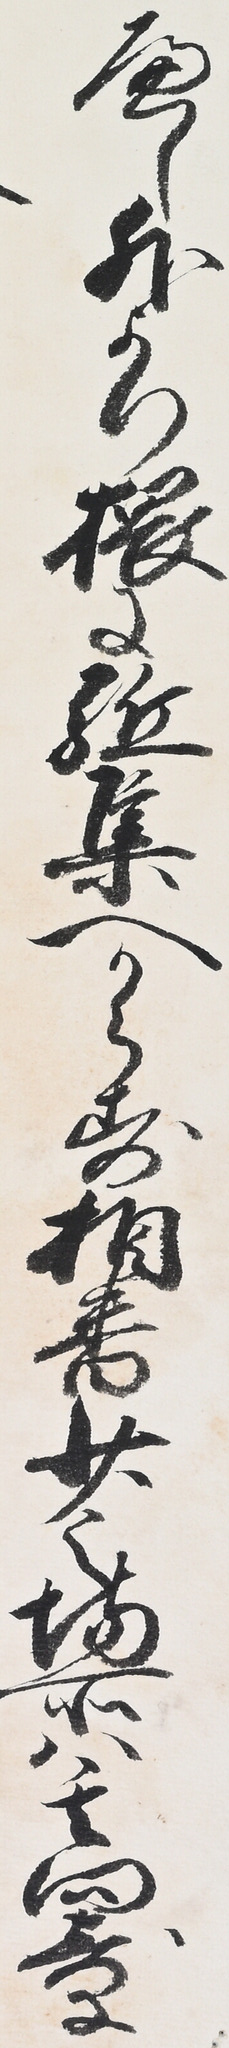へし外より猥に駈集へからす相番少之場所ハ其向寄に
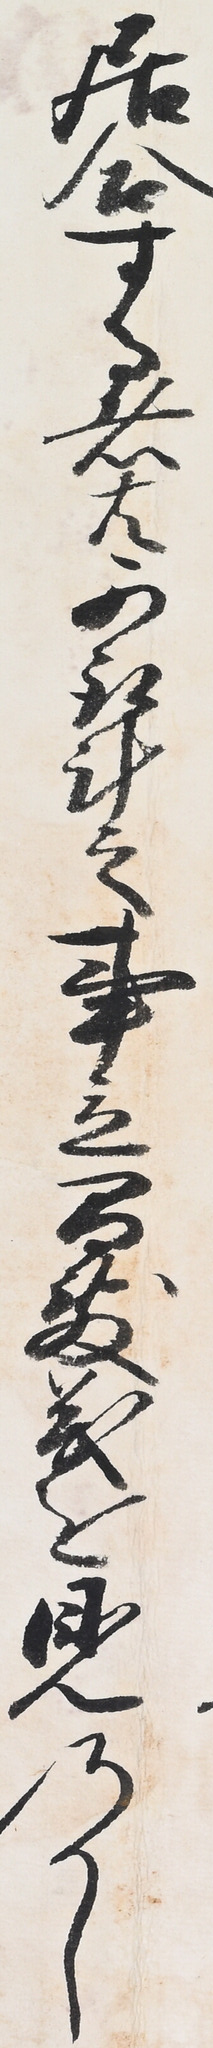居合する者共可取斗之事立間敷義を見のかし
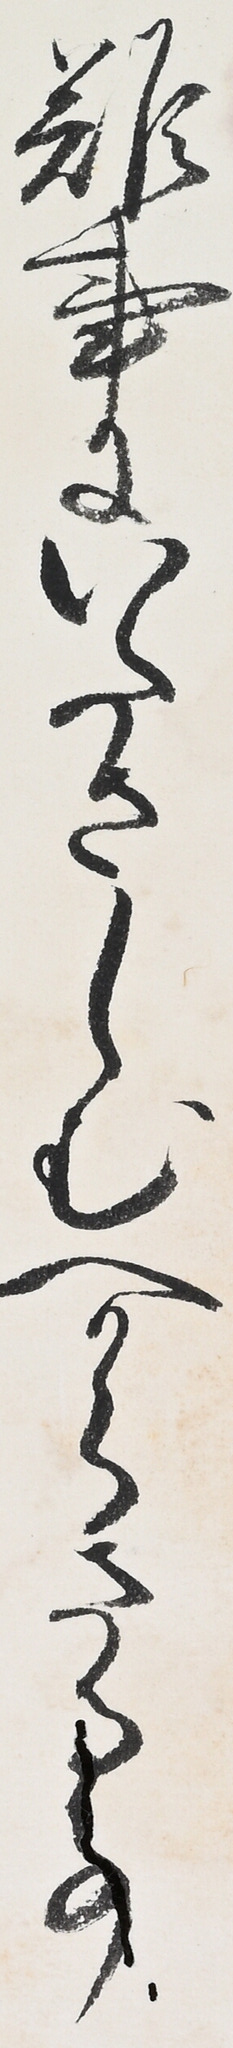難事にいたさしむへからさる事
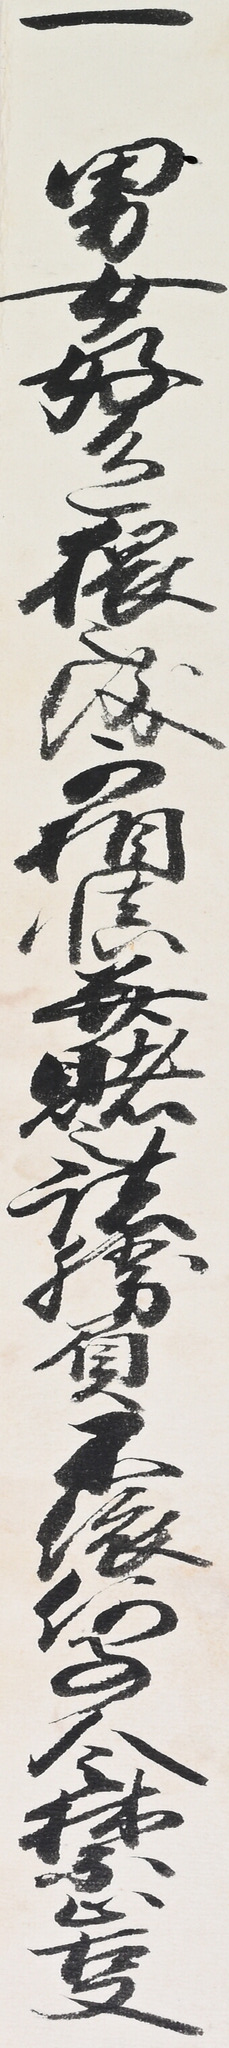一男女好色猥之儀可相慎幷賭之諸勝負不依何事令禁止事

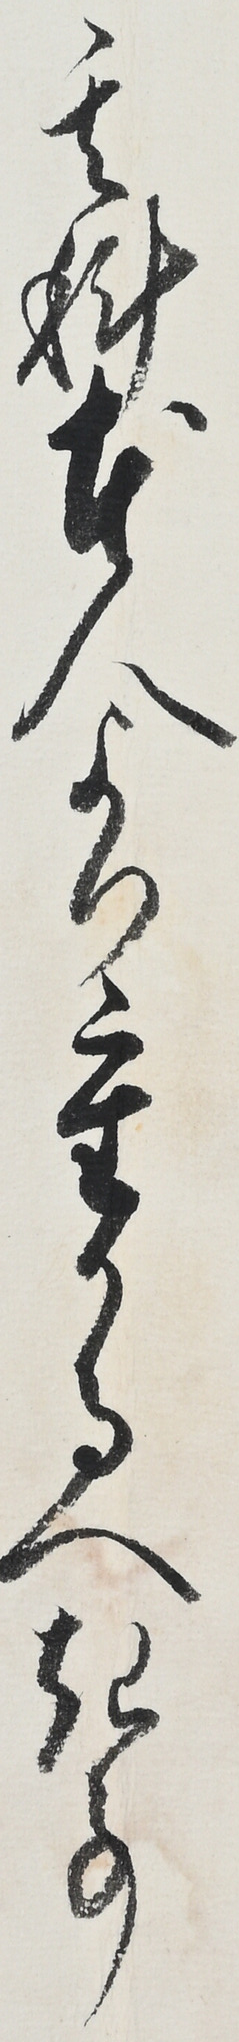其科本人より重かるへき事
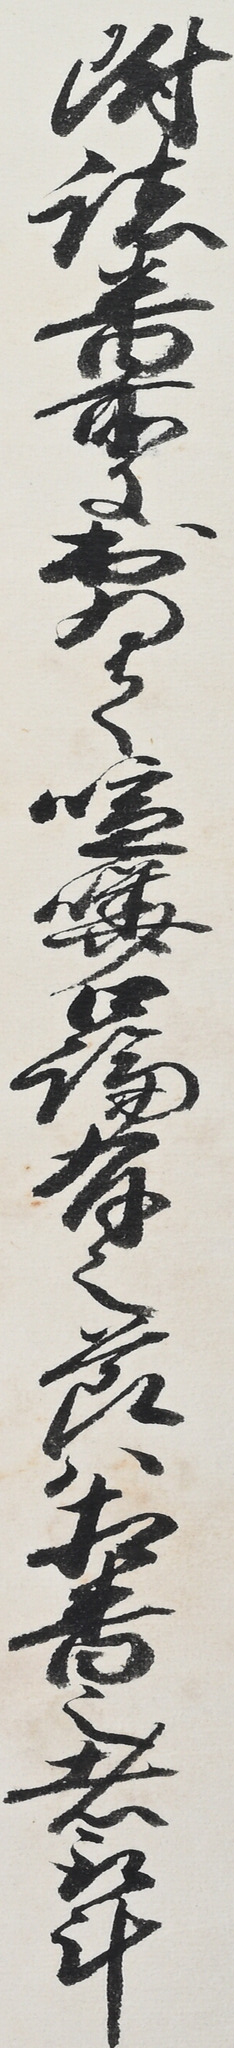附諸番所におゐて喧嘩口論有之節は相番之者取斗
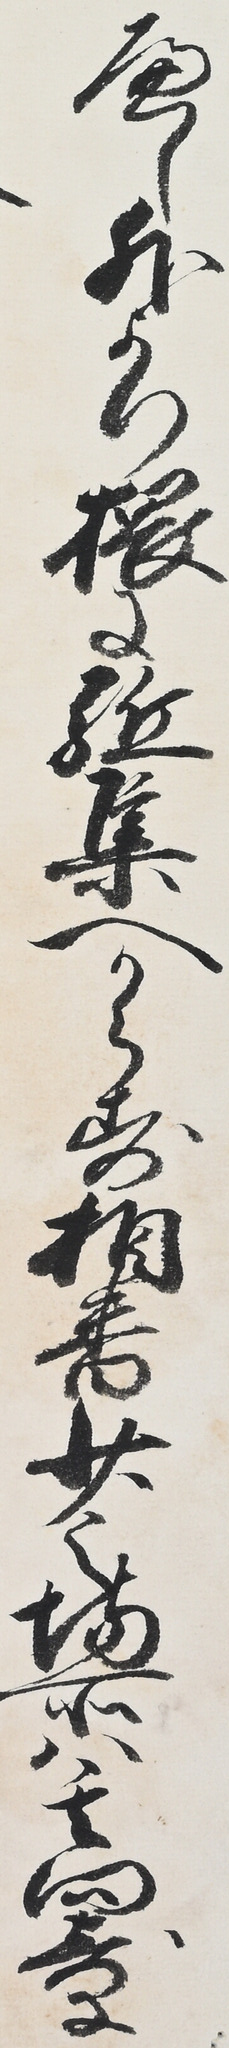へし外より猥に駈集へからす相番少之場所ハ其向寄に
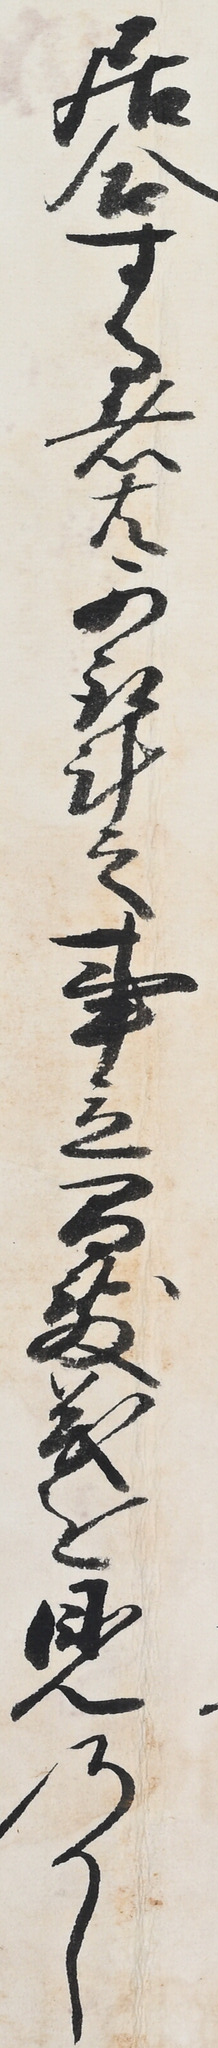居合する者共可取斗之事立間敷儀を見のかし
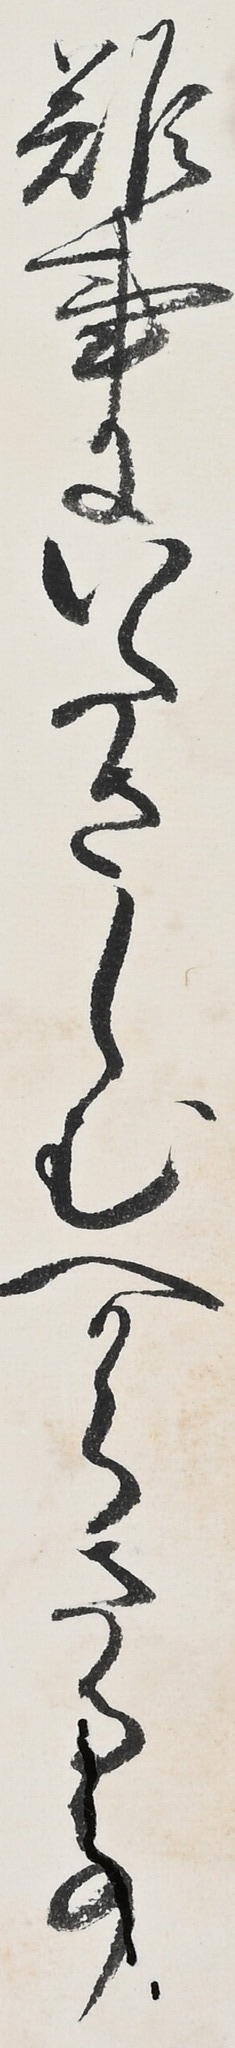難事にいたさしむへからさる事
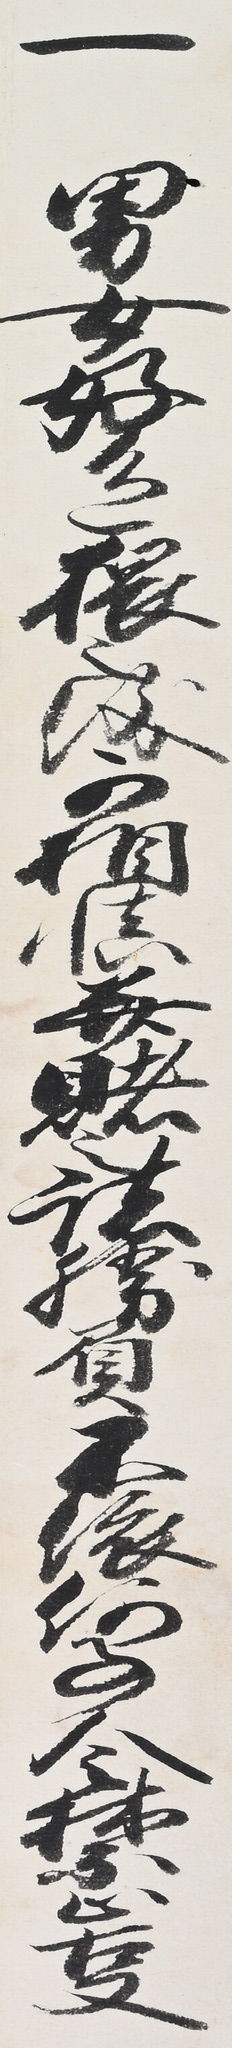一男女好色猥之儀可相慎幷賭之諸勝負不依何事令禁止事
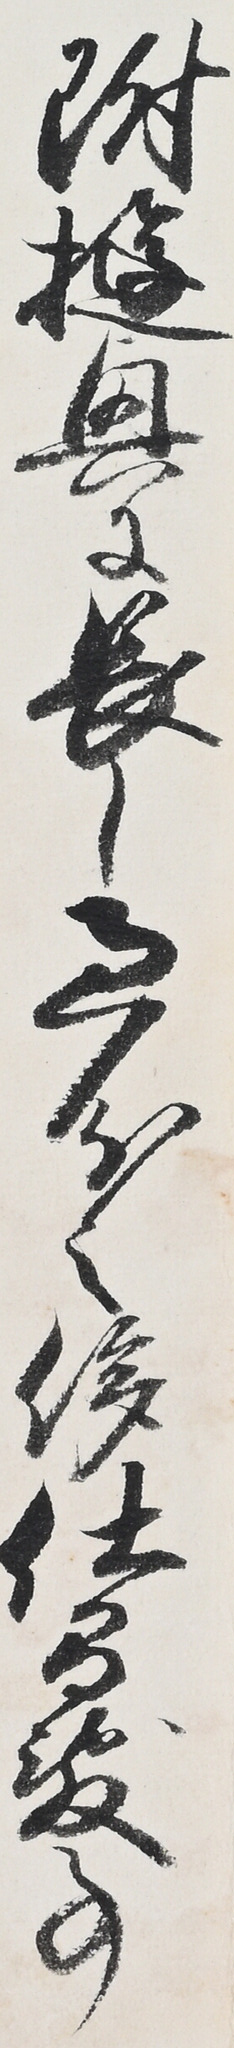附遊興に長し過分之侈仕間敷事
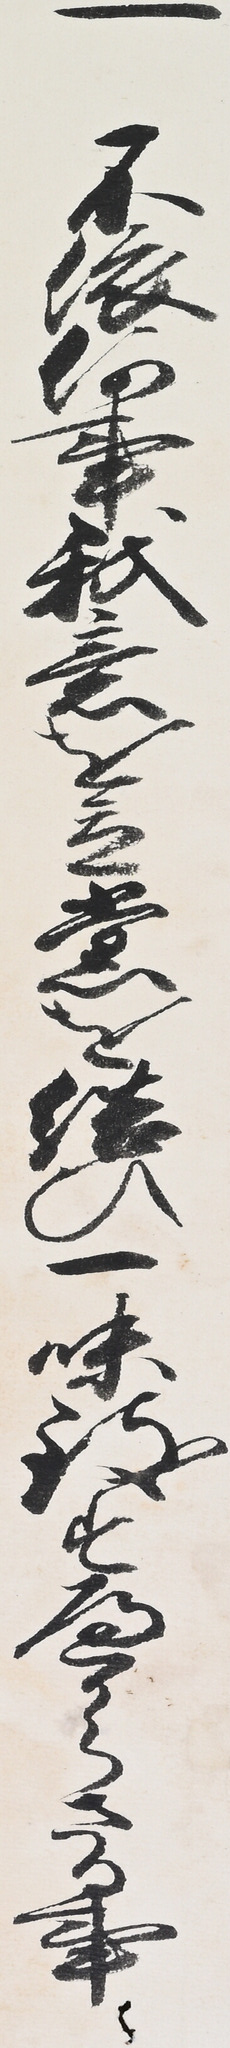一不依何事我意を立党を結ひ一味致すへからさる事
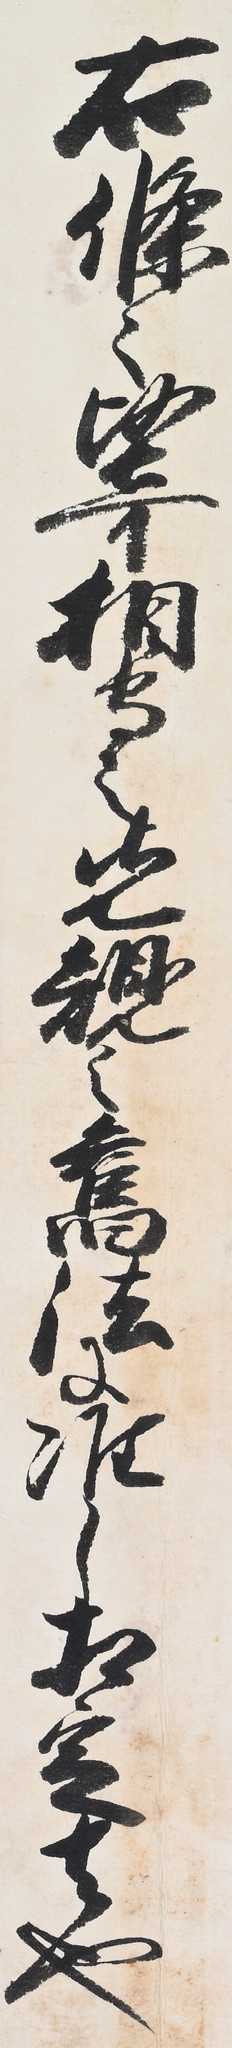右條々堅可相守之先規之旧法に准し相定者也
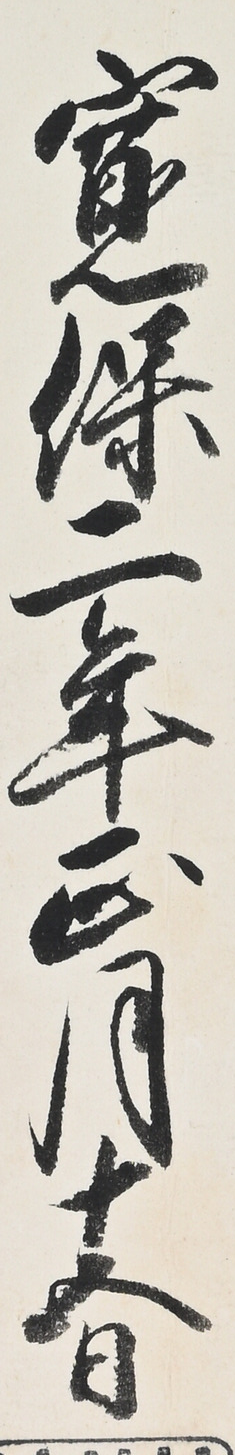寛保二年正月十五日
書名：御条目〔同文二通一括〕
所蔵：伊那市立高遠町図書館・合同会社AMANE
